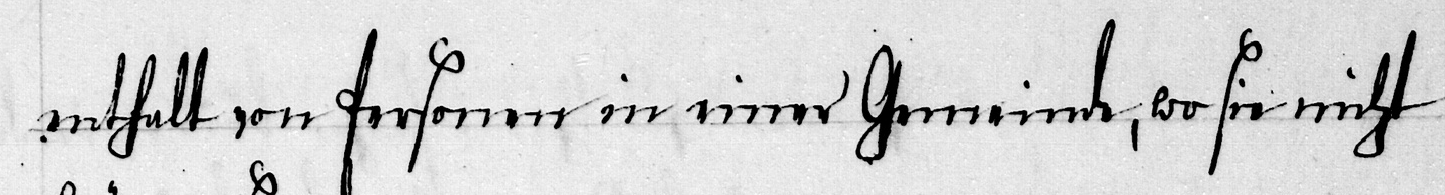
enthalt von Personen in einer Gemeinde, wo sie nicht
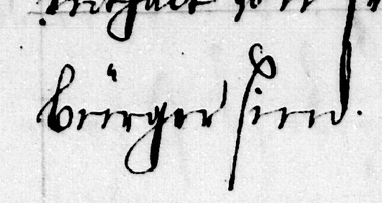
Bürger sind.
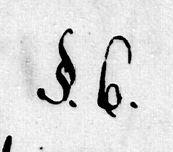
§. 6.
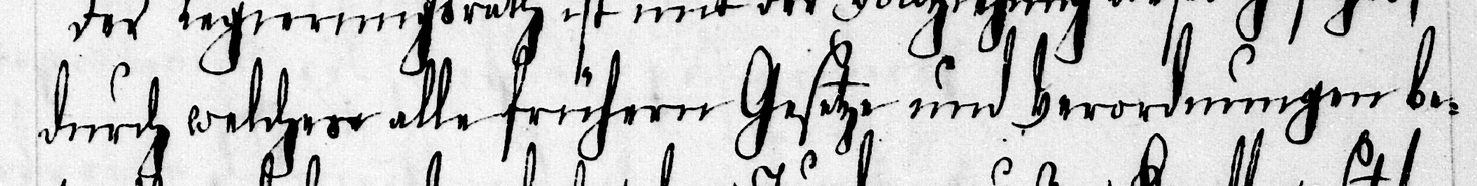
durch welches alle frühern Gesetze und Verordnungen be¬
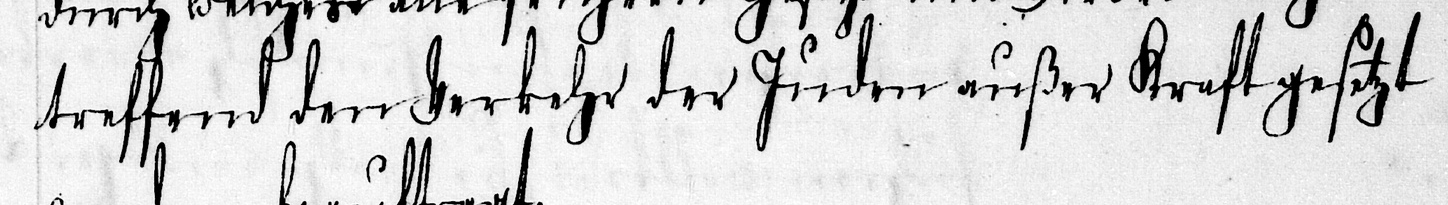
treffend den Verkehr der Juden außer Kraft gesetzt
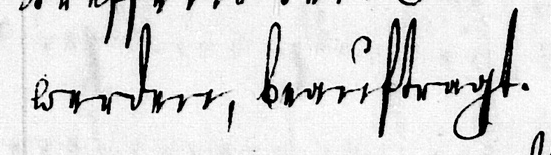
werden, beauftragt.
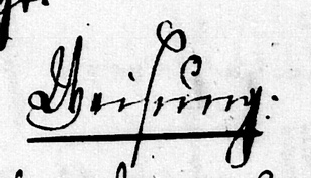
Weisung:
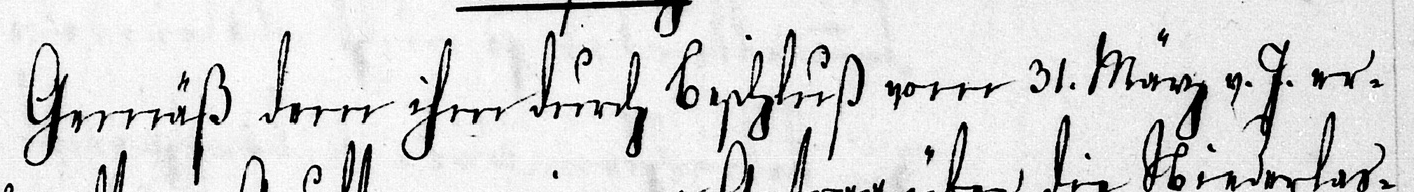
Gemäß dem ihm durch Beschluß vom 31. März v. J. er¬
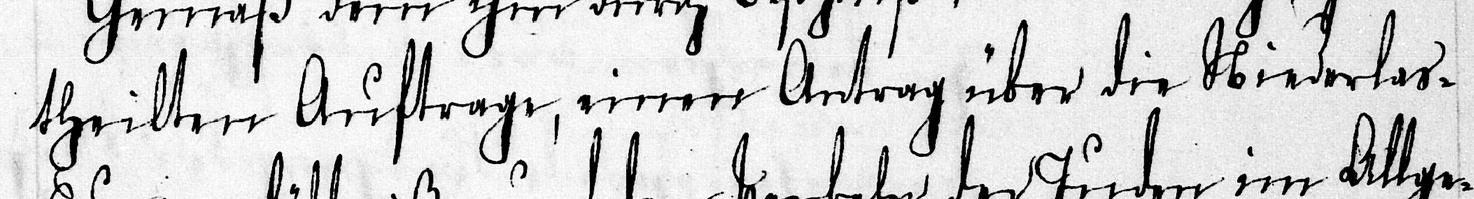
theilten Auftrage, einen Antrag über die Niederlaß¬
